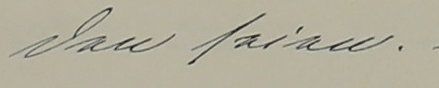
den seien.
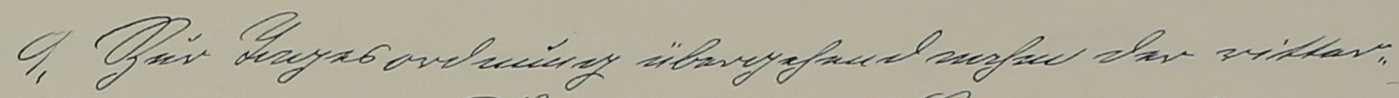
9. Zur Tagesordnung übergehend nahm der ritter-
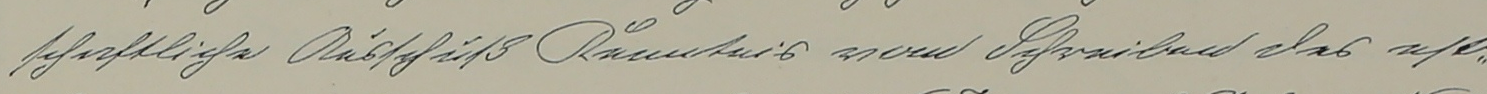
schaftliche Ausschuß Kenntnis vom Schreiben des est-
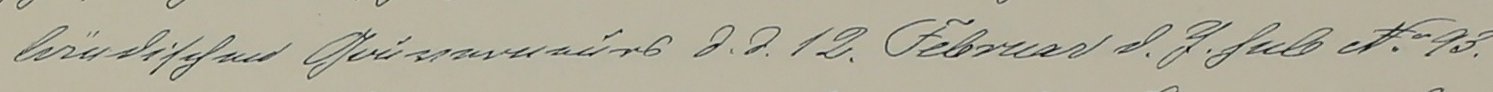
ländischen Gouverneurs d.d. 12. Februar d.J. sub No. 93.
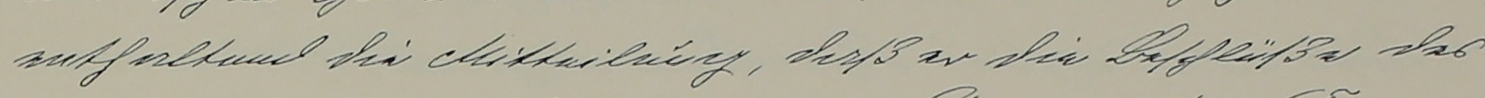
enthaltend die Mitteilung, daß er die Beschlüße des
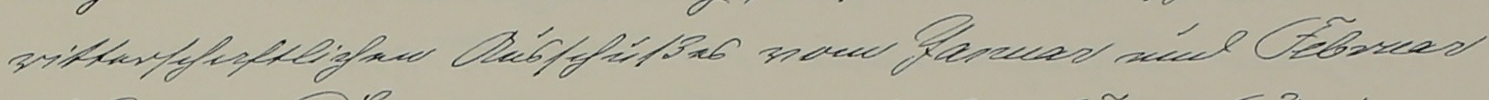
ritterschaftlichen Ausschußes vom Januar und Februar
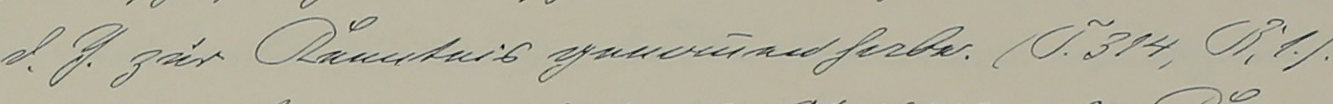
d.J. zur Kenntnis genommen habe. (T.314, R.1).
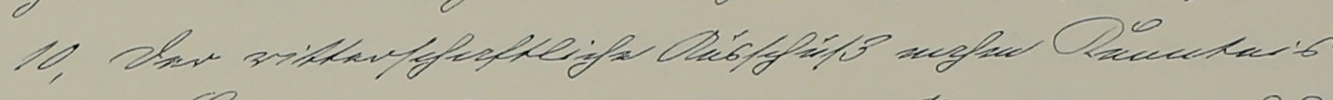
10. Der ritterschaftliche Ausschuß nahm Kenntnis
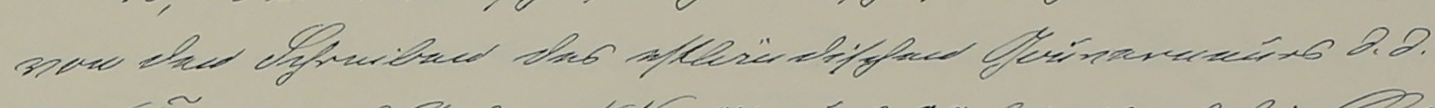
von dem Schreiben des estländischen Gouverneurs d.d.
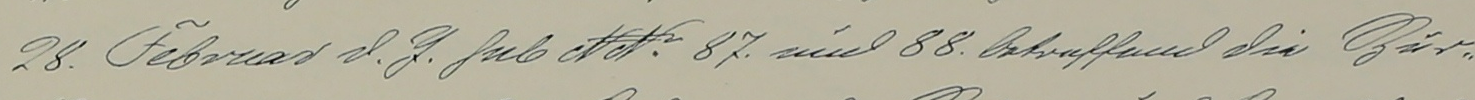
28. Februar d.J. sub NNo. 87. und 88. betreffend die Zur-
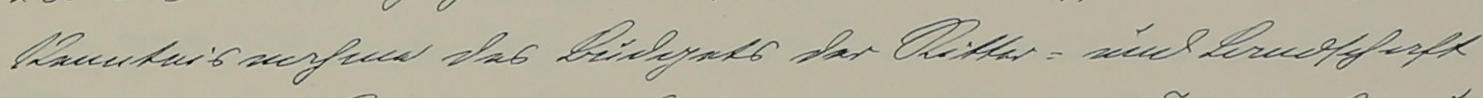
kenntnisnahme des Budgets der Ritter- und Landschaft
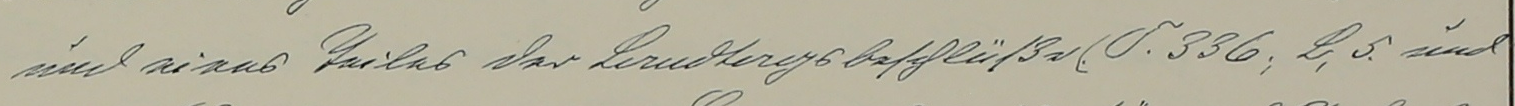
und eines Teils der Landtagsbeschlüße (T.336; L.5 und
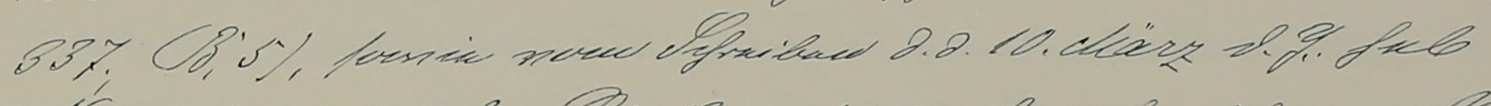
337. B.5), sowie vom Schreiben d.d. 10. März d.J. sub
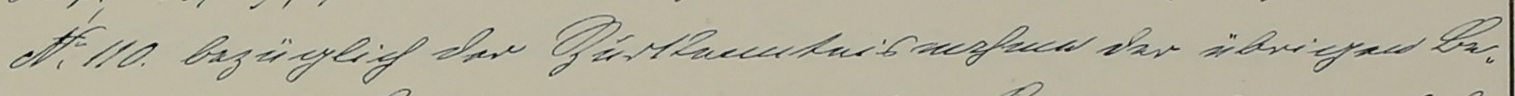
No. 110 bezüglich der Zurkenntnisnahme der übrigen Be-
